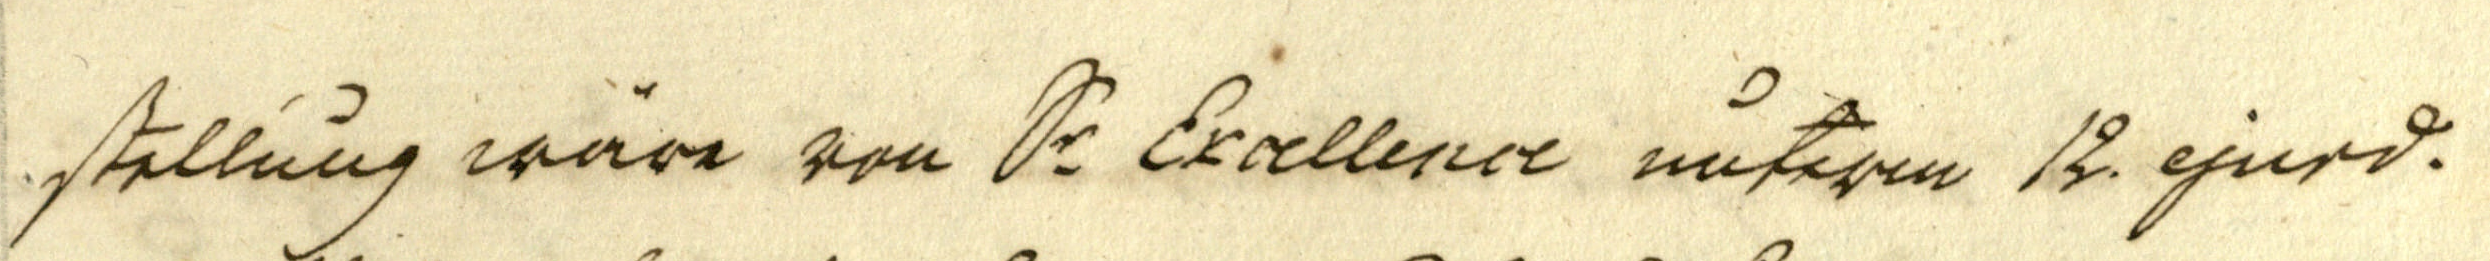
stellung wäre von Sr Excellence unterm 12. ejusd.
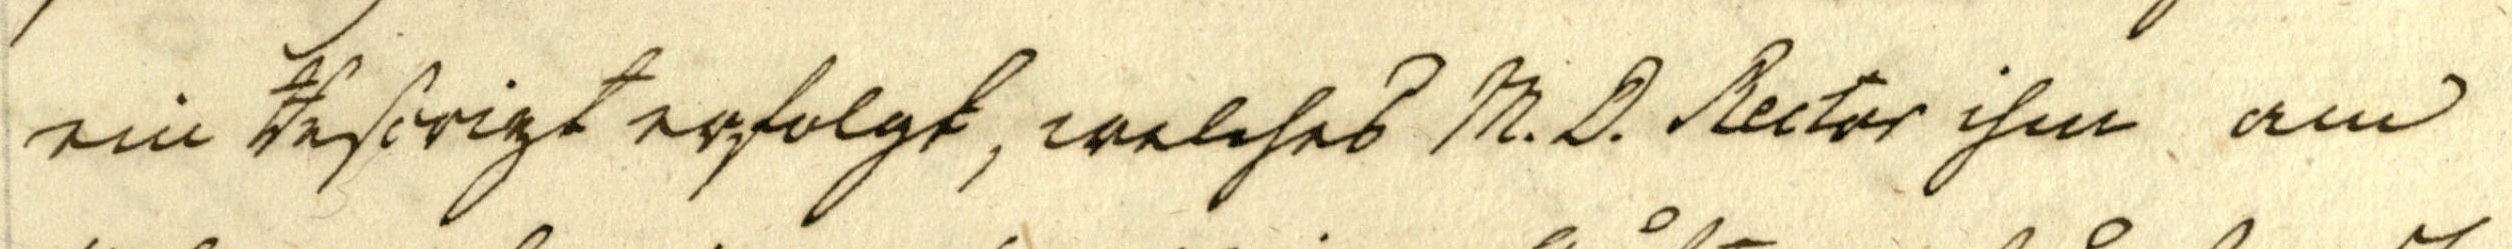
ein Rescript erfolgt, welches M. D. Rector ihm am
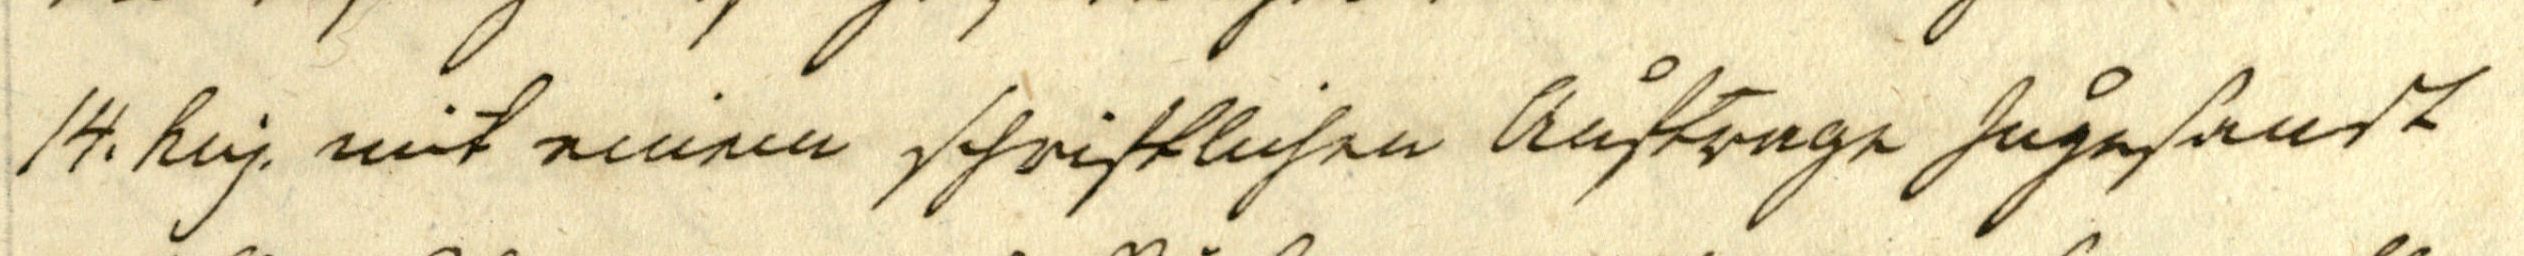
14. huj. mit einem schriftlichen Auftrage zugesandt
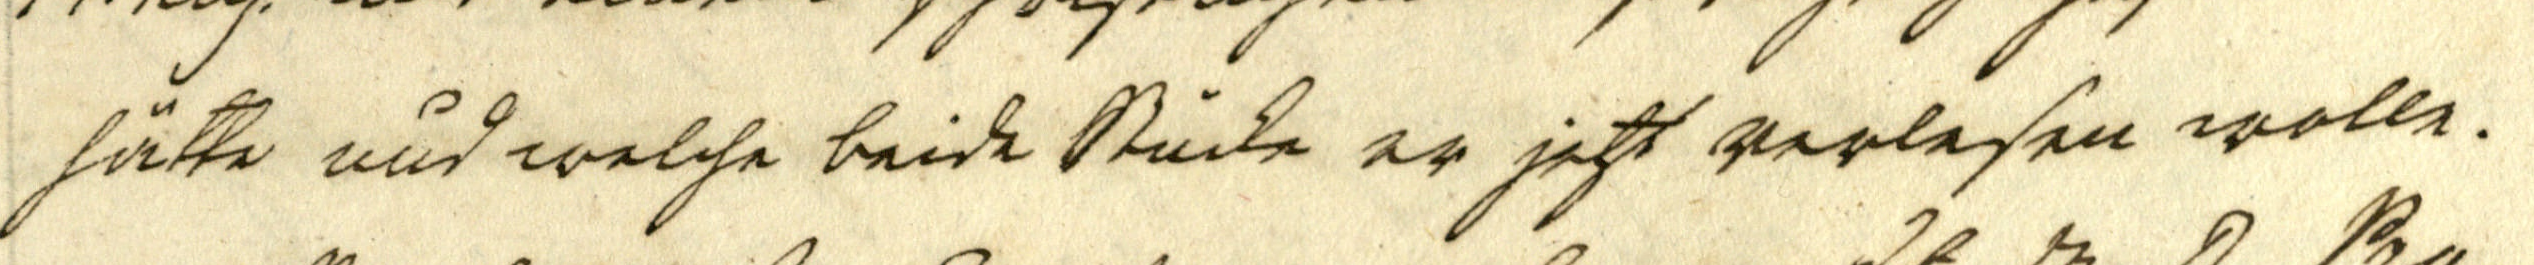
hätte und welche beide Stücke er jetzt verlesen wolle.
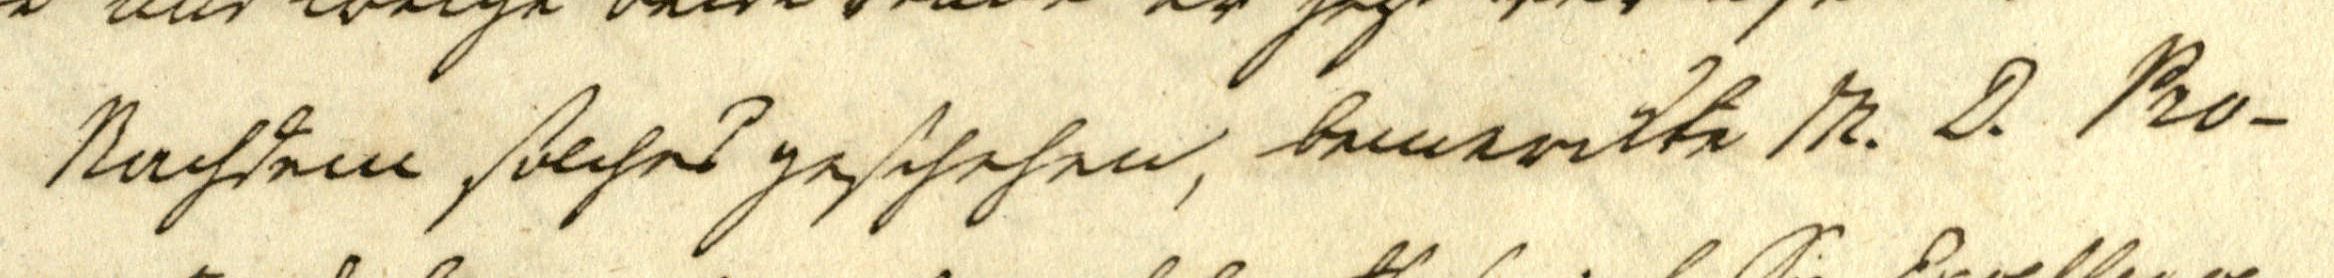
Nachdem solches geschehen, bemerckte M. D. Pro¬
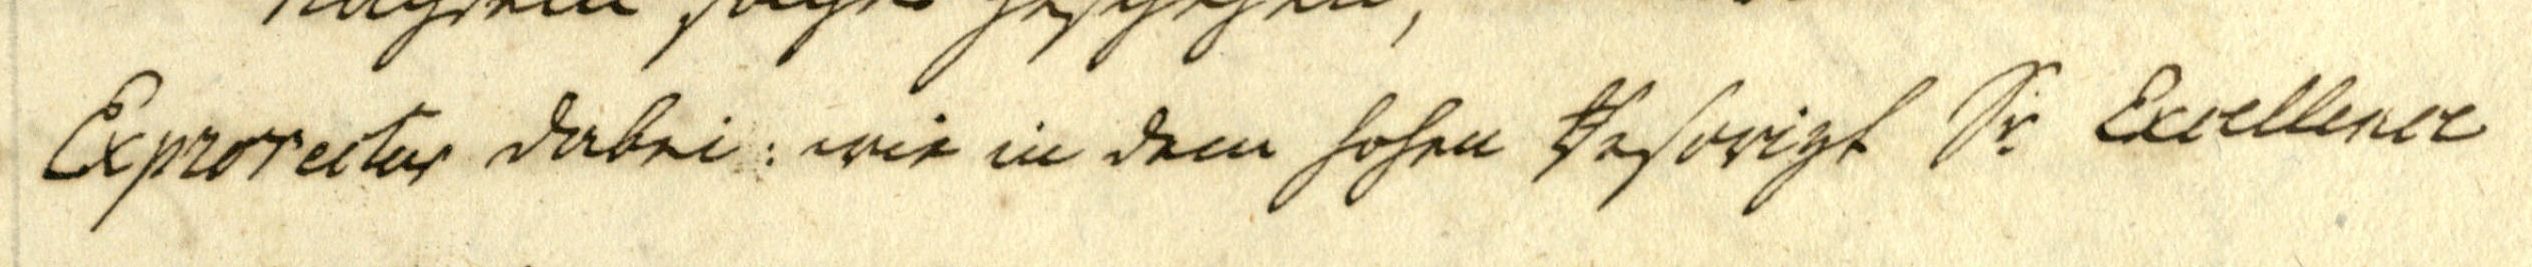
Exprorector dabei: wie in dem hohen Rescript Sr Excellence
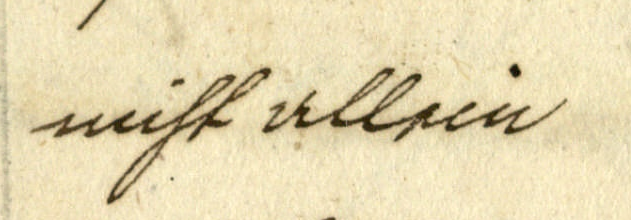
nicht allein
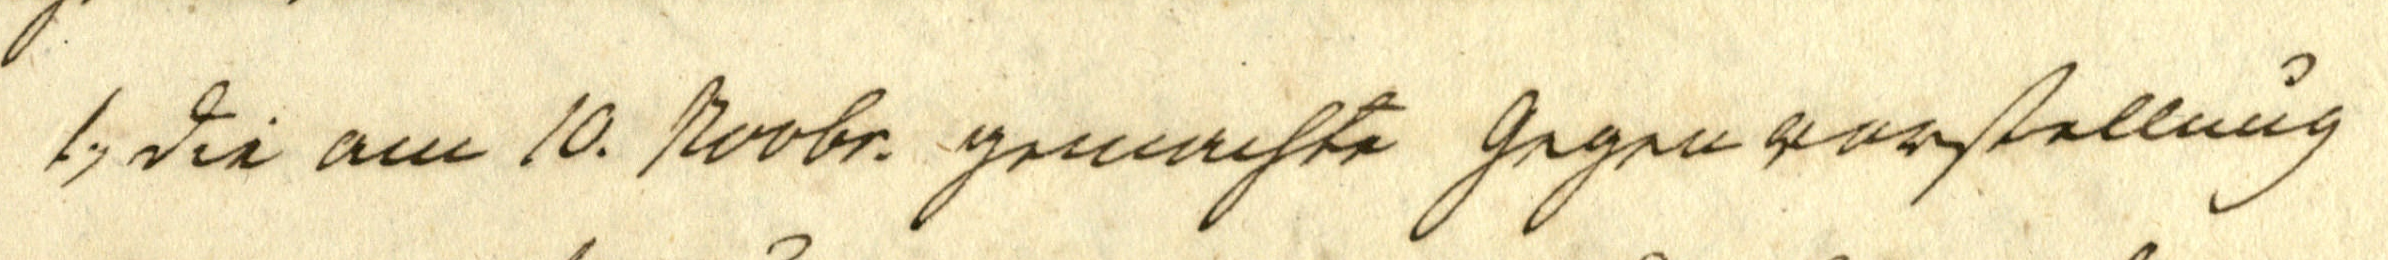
1., die am 10. Novbr. gemachte Gegen vorstellung
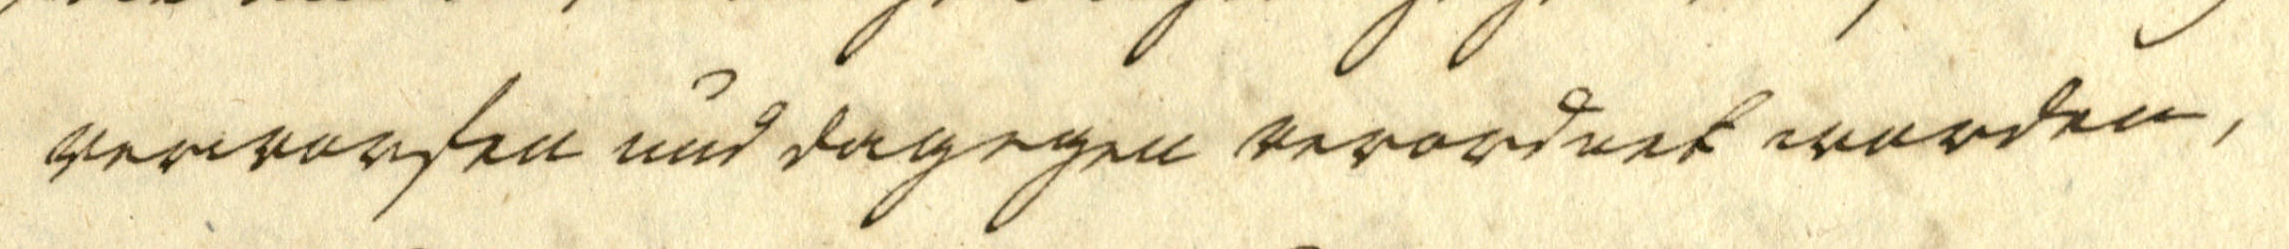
verworfen und dagegen verordnet worden,
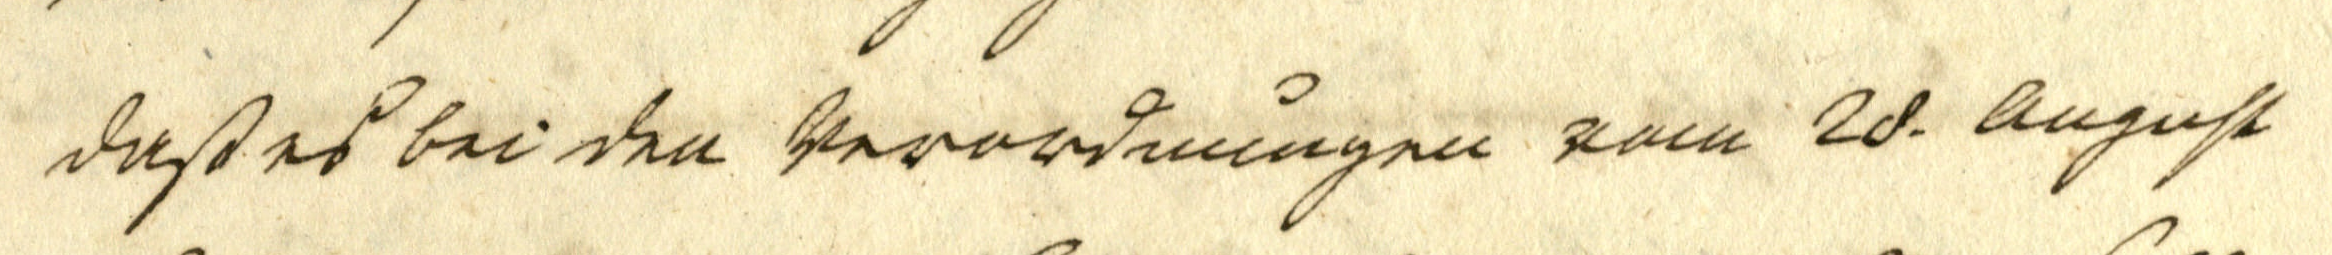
daß es bei den Verordnungen vom 28. August
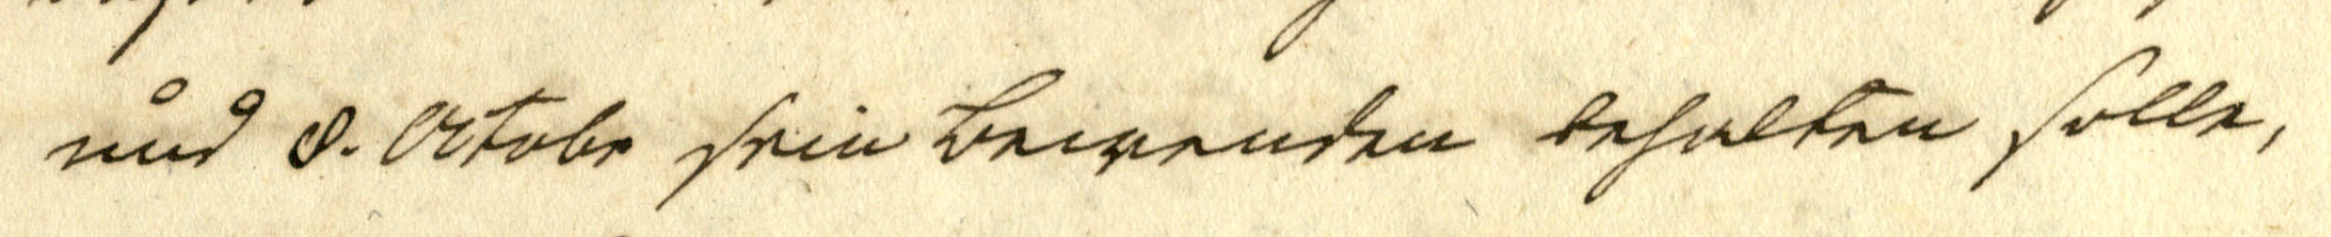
und 8. Octobr sein Bewenden behalten solle,
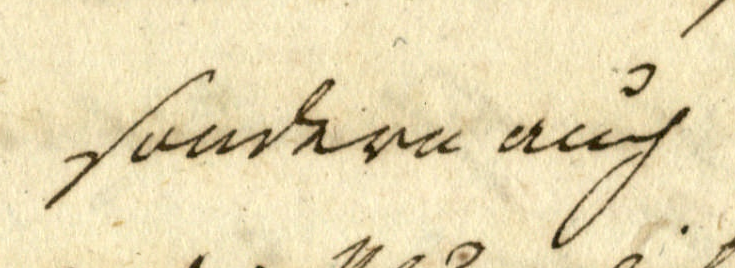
sondern auch
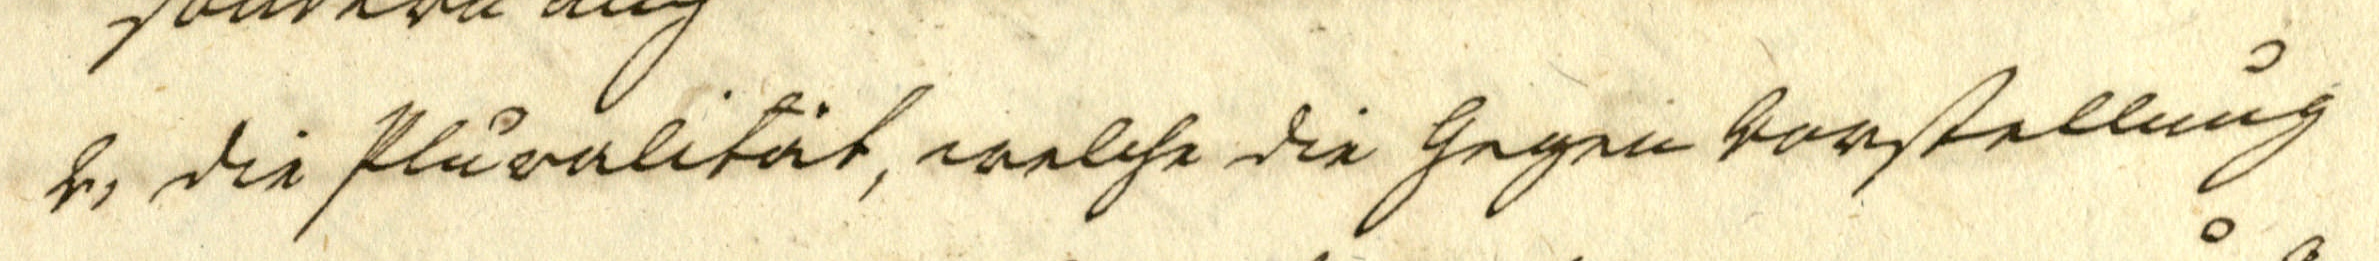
2., die Pluralität, welche die Gegen Vorstellung
